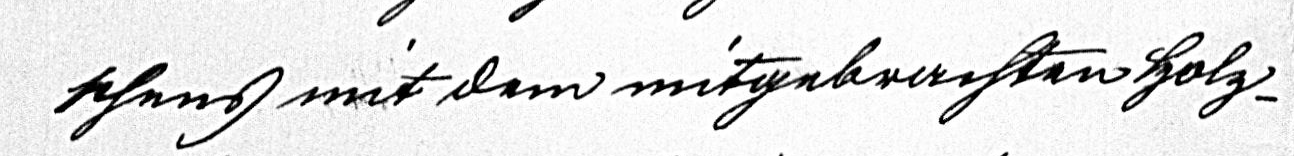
schens mit dem mitgebrachten Holz¬
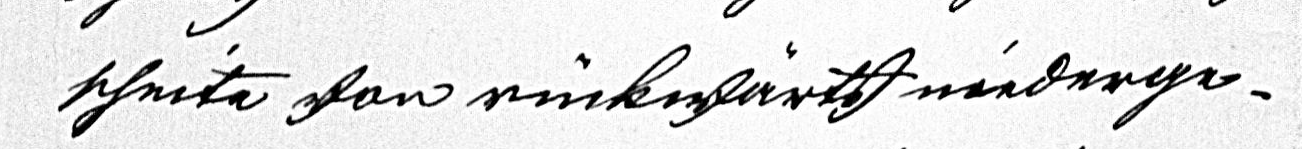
scheite von rückwärts niederge¬
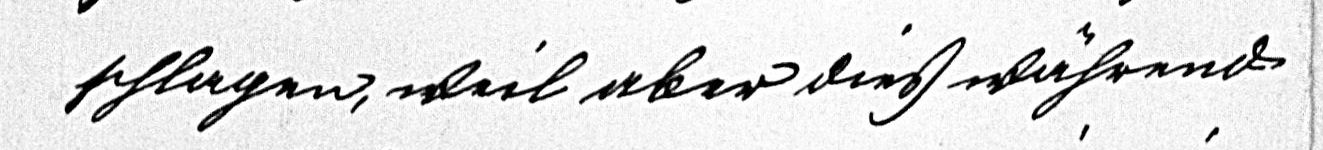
schlagen, weil aber dies während
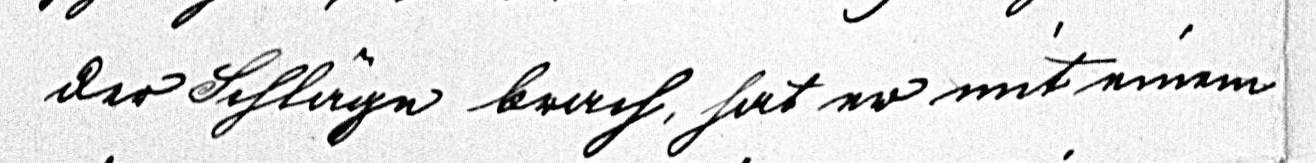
der Schläge brach, hat er mit einem
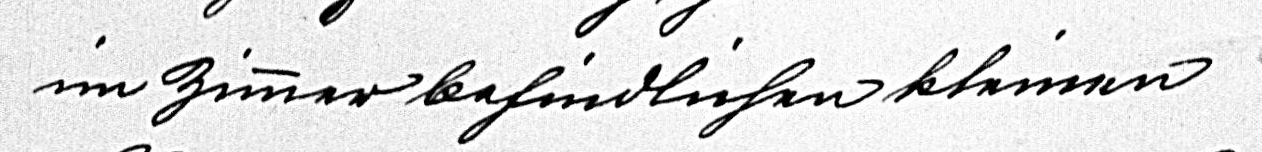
in Zimmer befindlichen kleinen
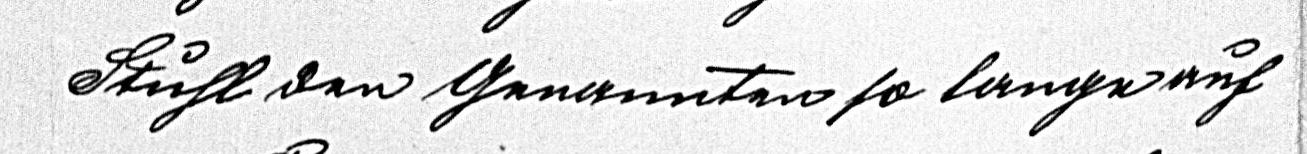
Stuhl den Genannten so lange auf
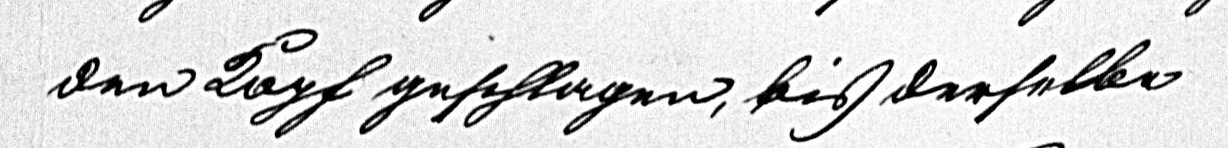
den Kopf geschlagen, bis derselbe
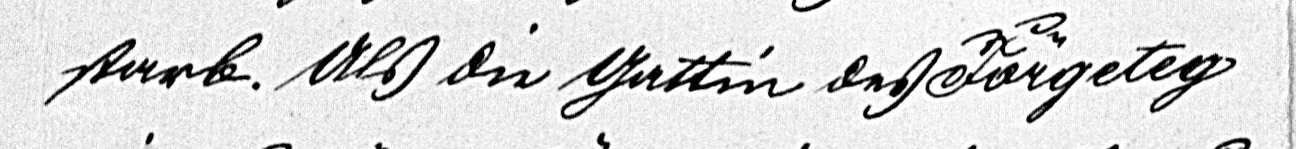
starb. Als die Gattin des Förgeteg
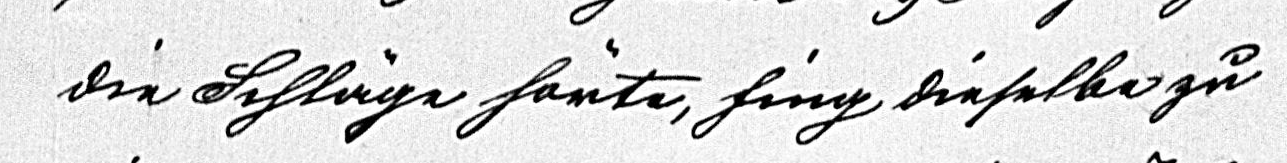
die Schläge hörte, fing dieselbe zu
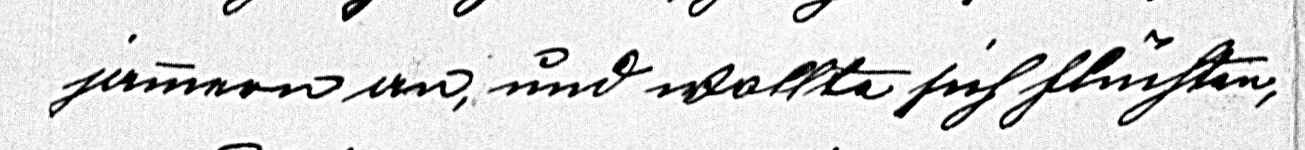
jammern an, und wollte sich flüchten,
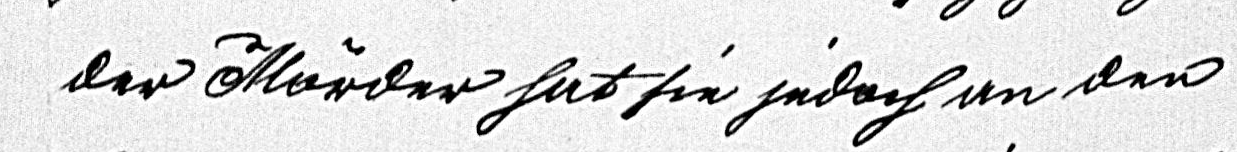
der Mörder hat sie jedoch an den
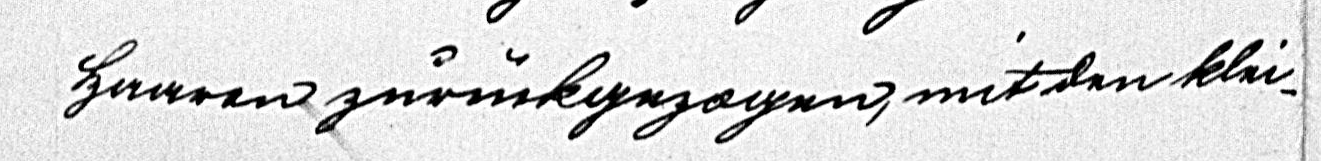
Haaren zurückgezogen, mit den klei¬
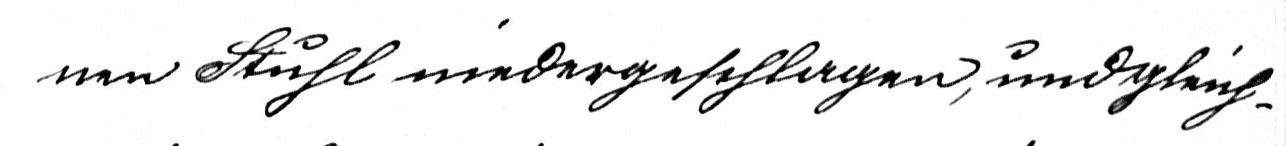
nen Stuhl niedergeschlagen, und gleich¬
